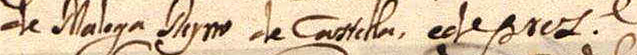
de Maloga Reyno de Castella, e de prez.e
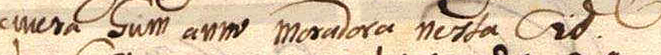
auera hum anno moradora nesta Cid.e
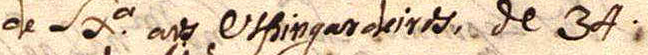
de Lx.a aos espingardeiros, de 34.
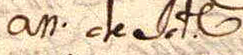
an. de Id̄.e
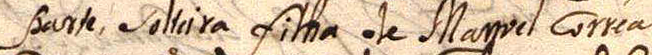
parte, solteira filha de Manoel Correa
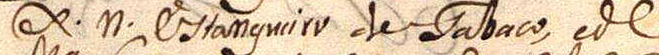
x. n. estanqueiro de Tabaco, e de
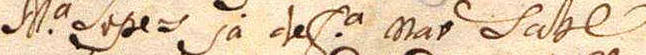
M.a Lopes ja def.a naõ sabe
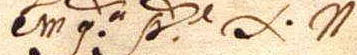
em q.ta p.te x. n.
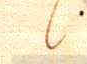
I.
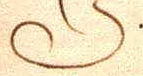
3.
